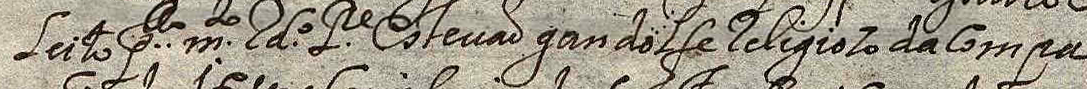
Leito p.lo m.to Rd.o P.e Esteuaõ gandolfe Religiozo da compa
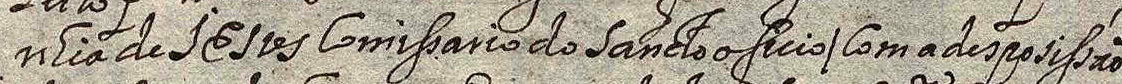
nhia de IEsvs Comissario do Sancto officio/ com a desposissaõ
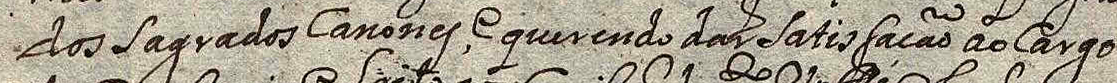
dos sagrados Canones, e querendo dar satisfaçaõ ao Cargo
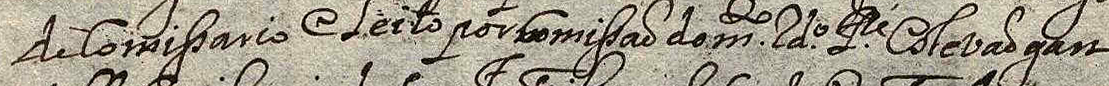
de Com̄issario eLeito por Comissaõ do m.to Rd.o P.e Estevaõ gan
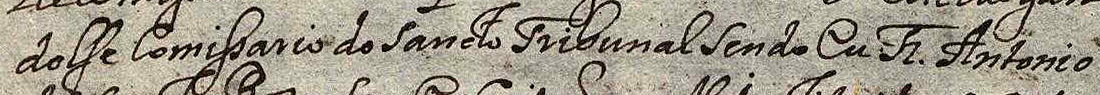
dolfe Comissario do Sancto Tribunal sendo Eu Fr. Antonio
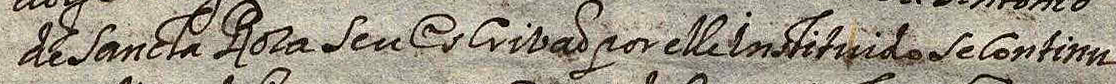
de Sancta Roza seu escrivaõ por elle instituido se continu
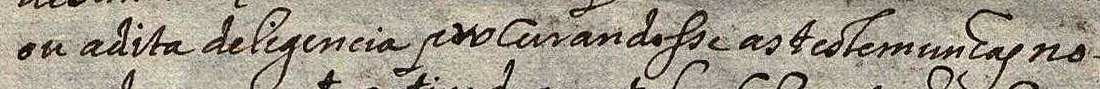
ou a dita deligencia procurandosse as testemunhas no
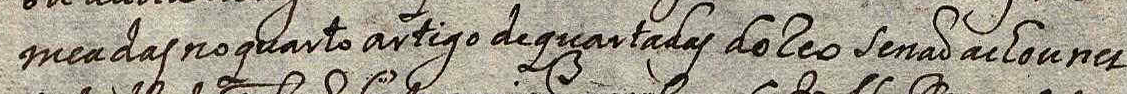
meadas no quarto artigo de quartadas do Reo se naõ achou nes
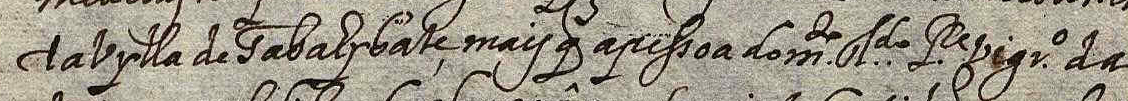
ta Vylla de Tabahybate, mais q̄ a pessoa do m.to R.do P.e vigr.o da
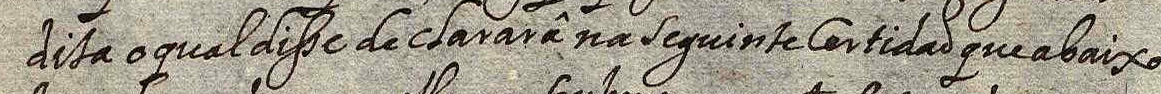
dita o qual disse declarará na seguinte Certidaõ que abaixo
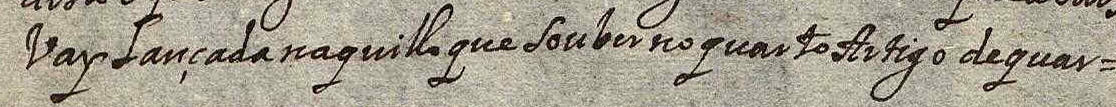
Vay lançada naquillo que souber no quarto Artigo de quar
